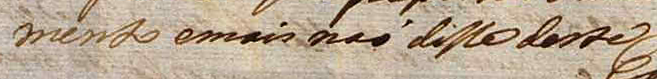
mento e mais naõ disse deste
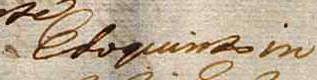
E do quinto in
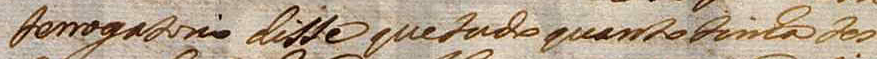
terrogatorio disse que tudo quanto tinha tes
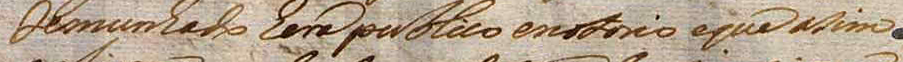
temunhado hera publico e notorio e que asim
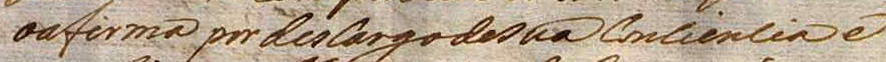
o afirma por descargo de sua conciencia e
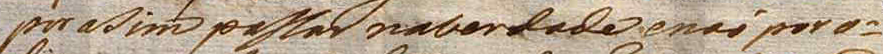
por asim passar na verdade e naõ por o
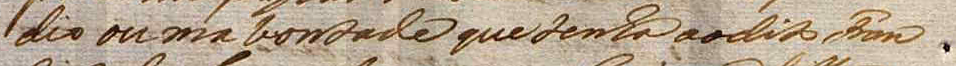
dio ou ma vontade que tinha ao dito Fran
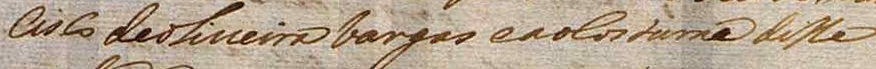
CisCo de oliueira vargas e ao Costume disse
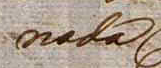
nada
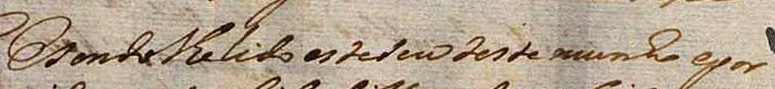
E sendolhe lido este seu testemunho e por
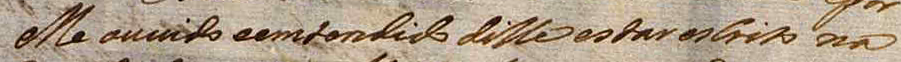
elle ouuido e emtendido disse estar esCrito na
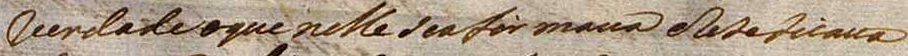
Verdade o que nelle se afirmaua e Reteficaua
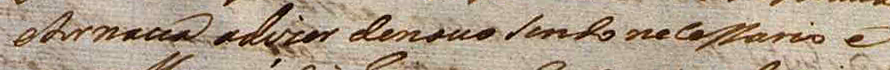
e tornaua a dizer de nouo sendo necessario e
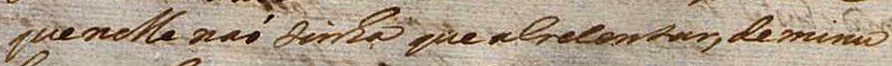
que nelle naõ tinha que aCrecentar, deminu
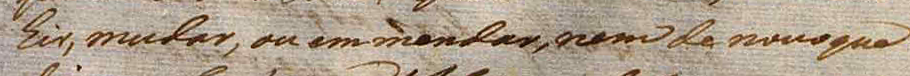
hir, mudar, ou emmendar, nem de nouo que
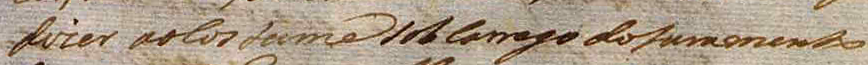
dizer ao costume sob carrego do Iuramento
